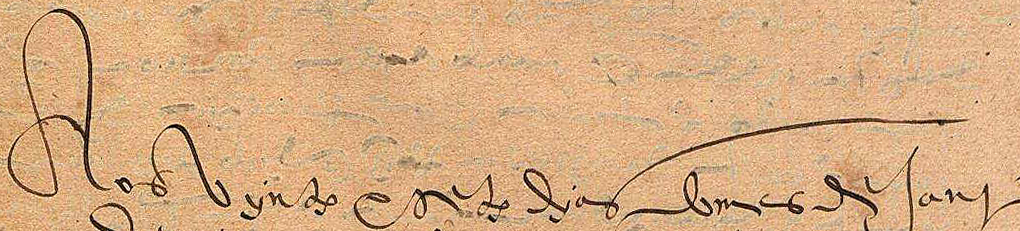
Aos vynte e sete dyas do mes de Janro
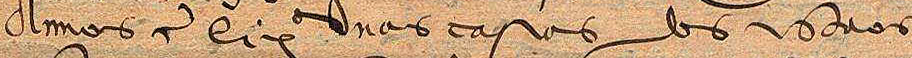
Annos e̅ lixa nas casas dos estaos
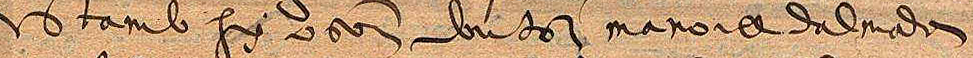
estamdo hy o so̅r doutor manoell dalmada
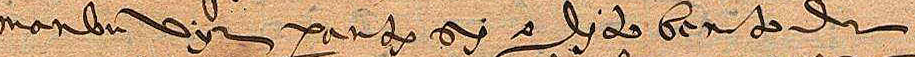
mandou vyr ꝑante sy o dyto bento de
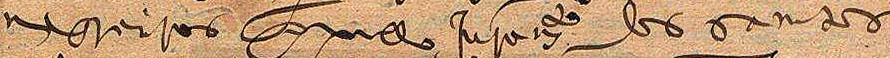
negreiros e pello Juramto dos samtos
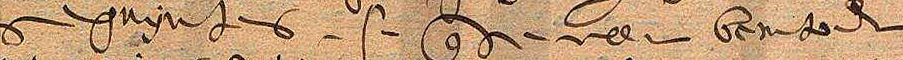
seguyntes .S. q̅ se elle bemto de
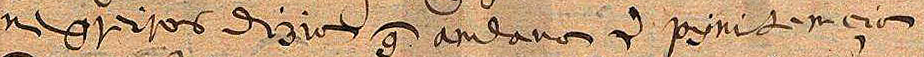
negreiros dizia q̅ amdaua e̅ pynitemçia
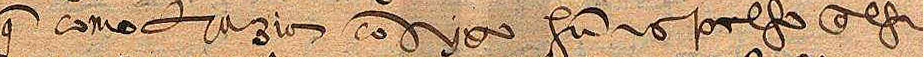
q̅ como trazia co̅sygo hu̅ espelho q̅ lhe
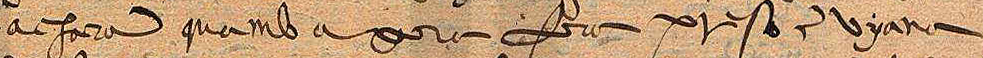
achara̅ quamdo agora fora preso e̅ vyana
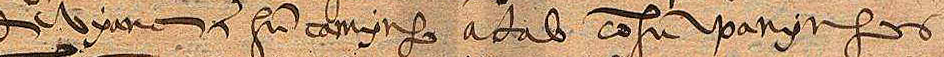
de vyana e̅ hu̅ camynho atado co̅ hu̅ panynhos
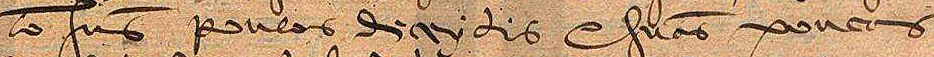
co̅ hu̅s poucos de ceytis e hu̅as poucas
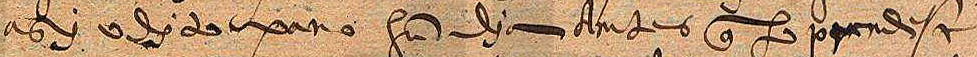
asy o dyto pano hu̅ dya Amtes q̅ ho prendese̅
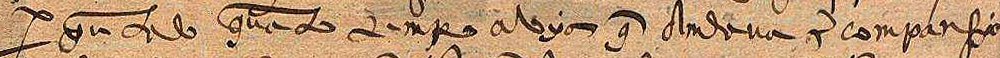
ꝑ gūtado qua̅to tempo avya q̅ Amdaua e̅ companhya
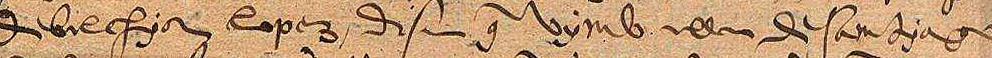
de belchyor lopez, dise q̅ vymdo elle de Samtyago
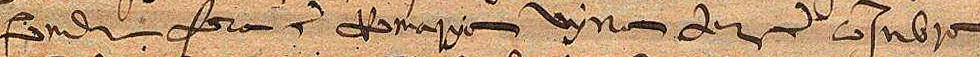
homde fora e̅ Romarya vyera ter e̅ coJnbra
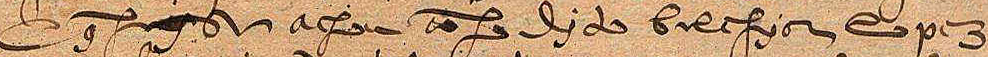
e q̅ hay se achou co̅ ho dyto belchyor lopez
